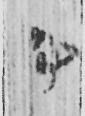身
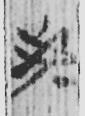我
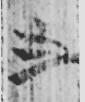之
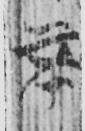不
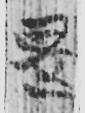是
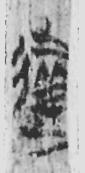{辶止㚔}（失）
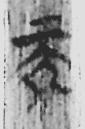而
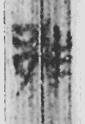邦
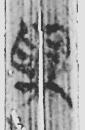受
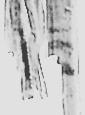亓
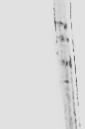不
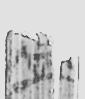{穴心皿}（寧）
